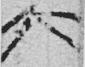六
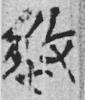拯
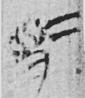馬
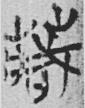○（壯）
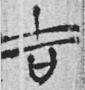吉
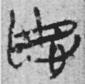悔
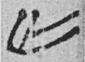亡
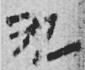九
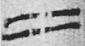二
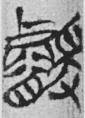○（渙）
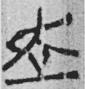走
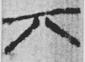亓（其）
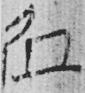凥
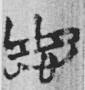悔
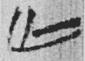亡
